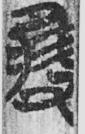（雘→獲）
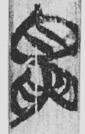要（腰）
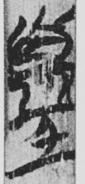頸
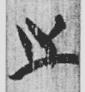之
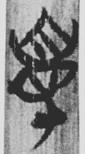辠（罪）
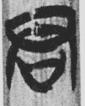君
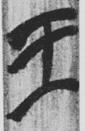王
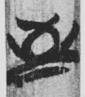至
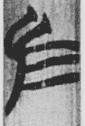於
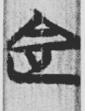定
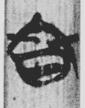冬（冬）
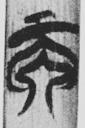而
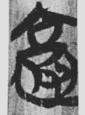被（披）
